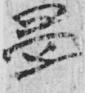是
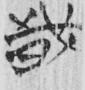歲（歲）
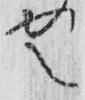也
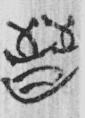晉
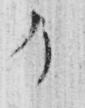人
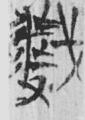○（伐）
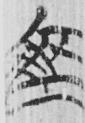齊
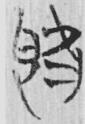既
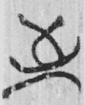至
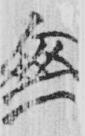齊
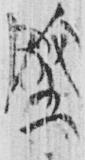○（地）
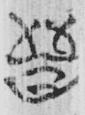晉
